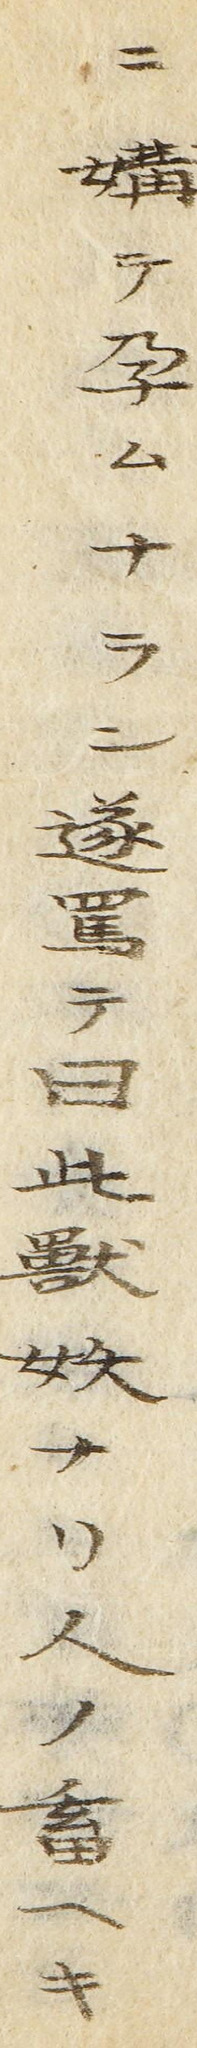ニ媾テ孕ムナラン遂罵テ曰此獣妖ナリ人ノ畜ヘキ

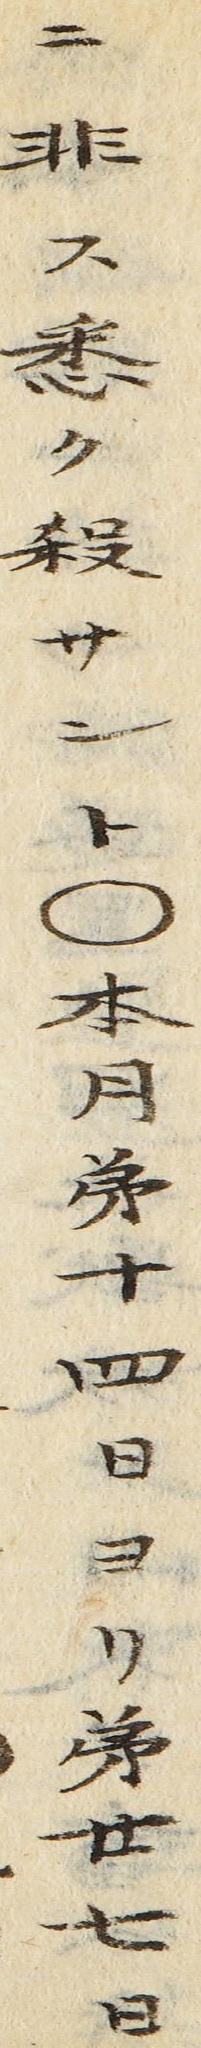ニ非ス悉ク殺サント◯本月第十四日ヨリ第廿七日
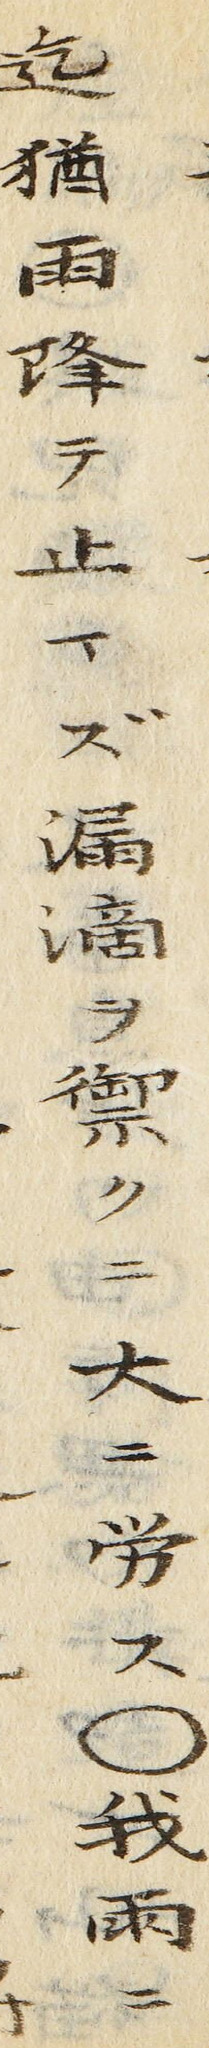迄猶雨降テ止マズ漏滴ヲ禦クニ大ニ労ス◯我雨ニ
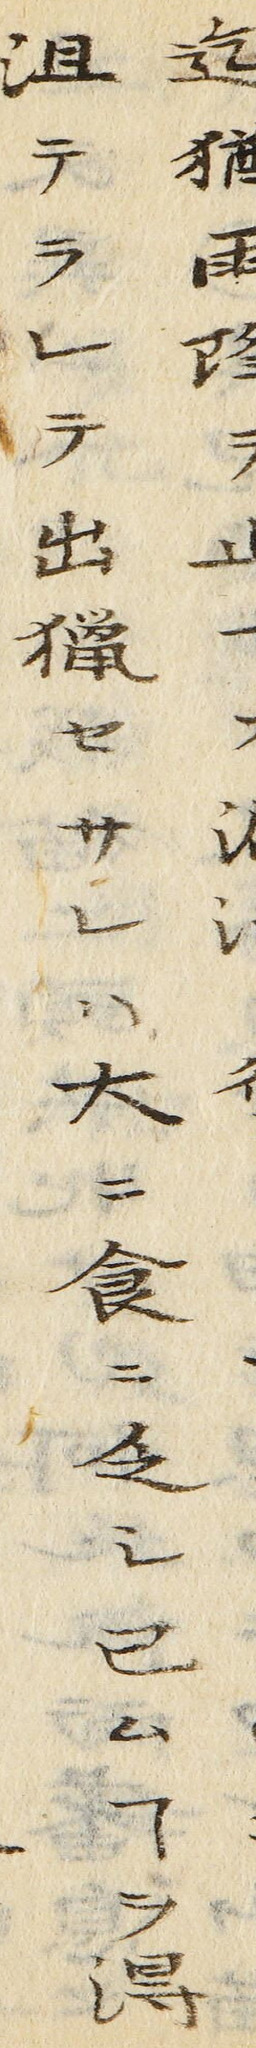沮テラレテ出猟セサレハ大ニ食ニ乏シ已ムコトヲ得
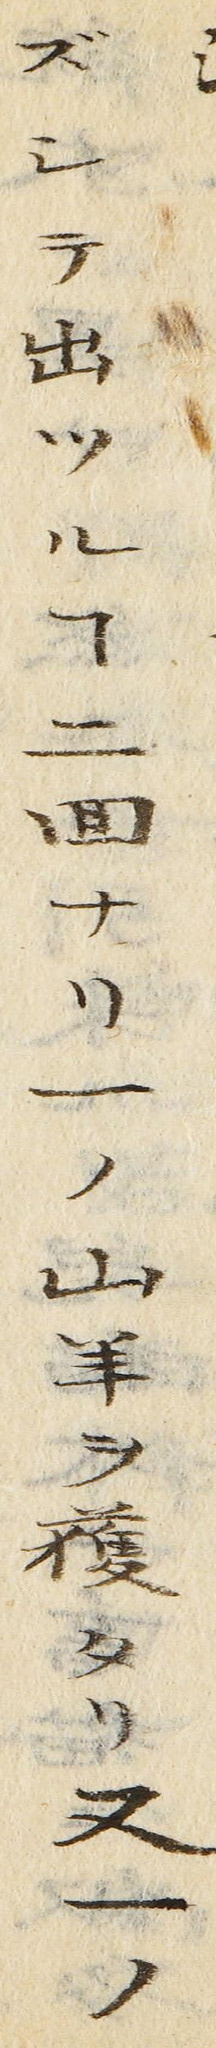ズシテ出ツルコト二回ナリ一ノ山羊ヲ獲タリ又一ノ
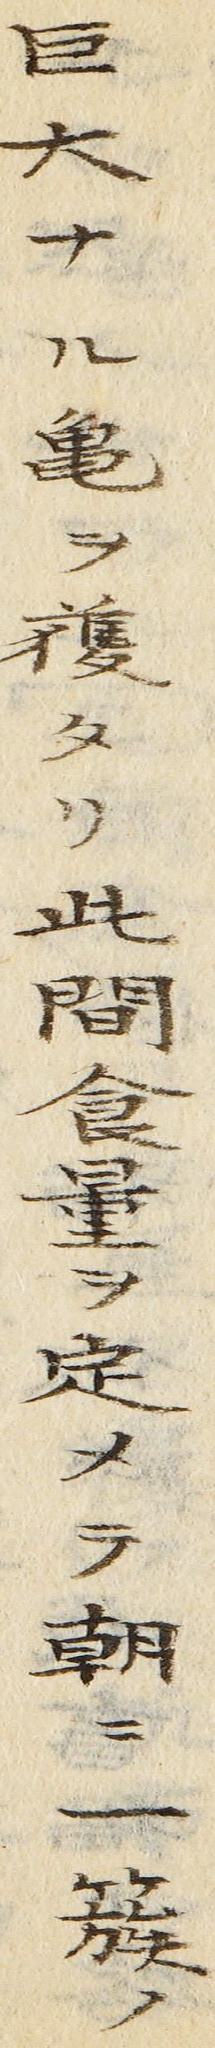巨大ナル亀ヲ獲タリ此間食量ヲ定メテ朝ニ一簇ノ
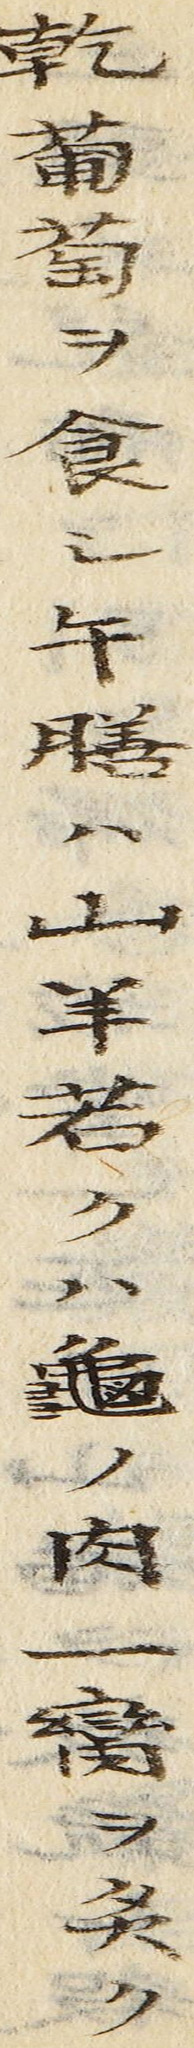乾葡萄ヲ食シ午膳ハ山羊若クハ亀ノ肉一臠ヲ炙ク
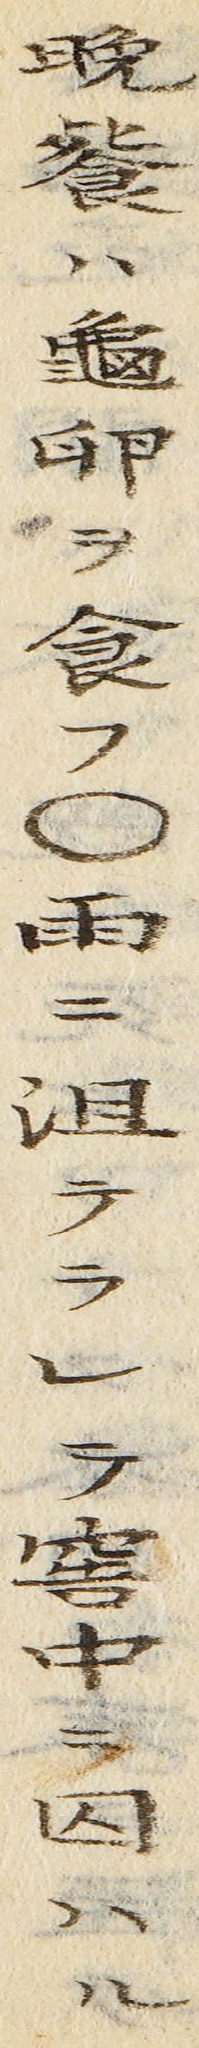晩餐ハ亀卵ヲ食フ◯雨ニ沮テラレテ窖中ニ囚ハル
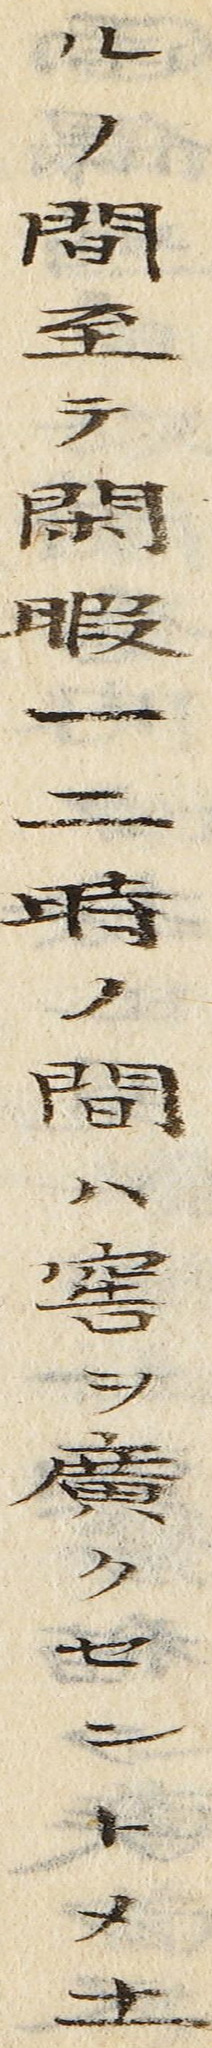ルノ間至テ閑暇一二時ノ間ハ窖ヲ広クセントシテ土
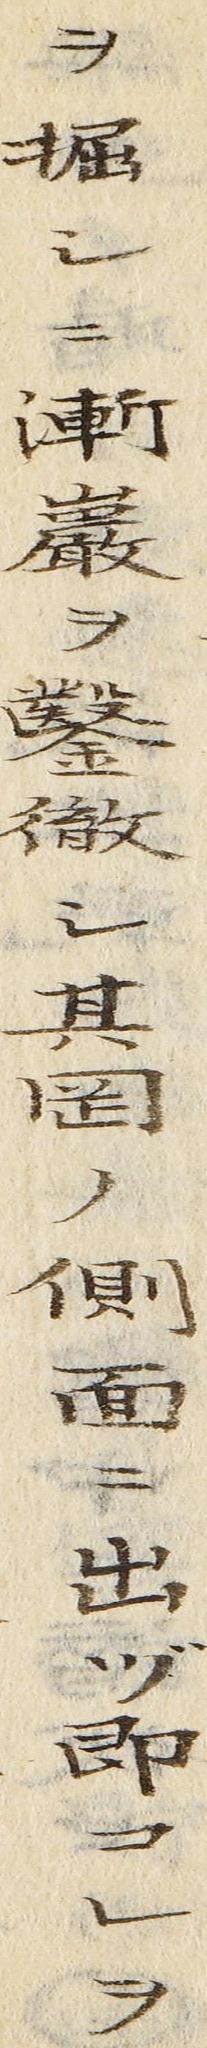ヲ掘シニ漸巌ヲ鑿徹シ其岡ノ側面ニ出ヅ即コレヲ
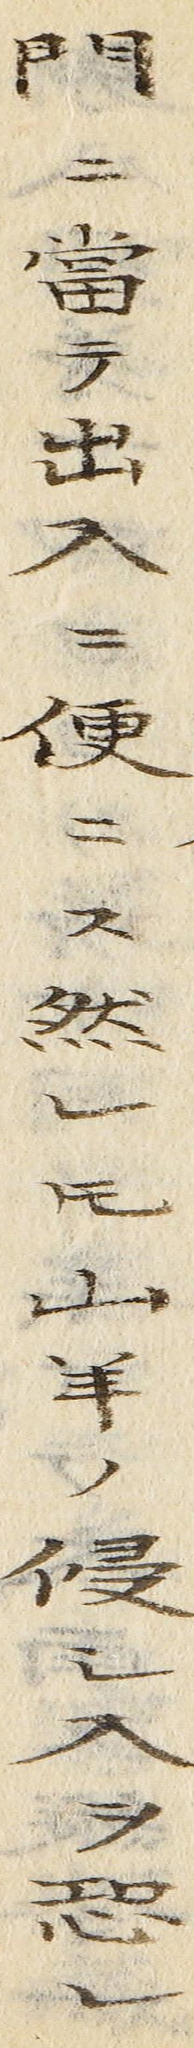門ニ当テ出入ニ便ニス然レトモ山羊ノ侵シ入ヲ恐レ
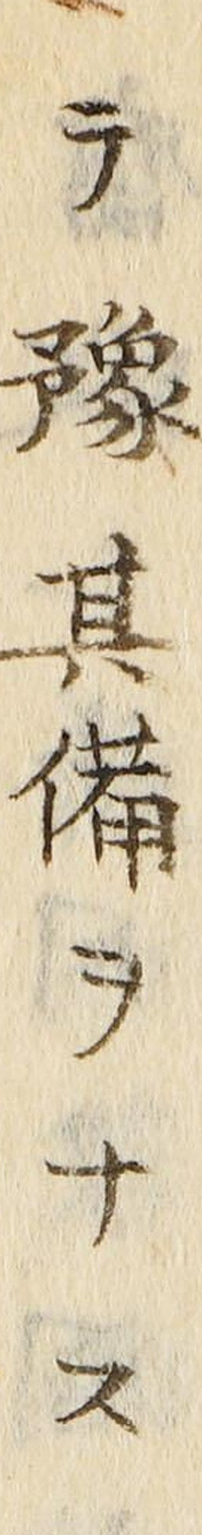テ予其備ヲナス
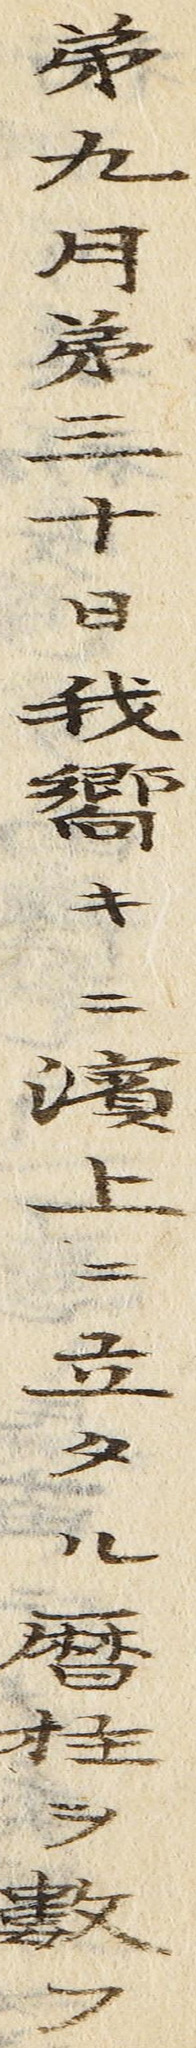第九月第三十日我嚮キニ浜上ニ立タル暦柱ヲ数フ
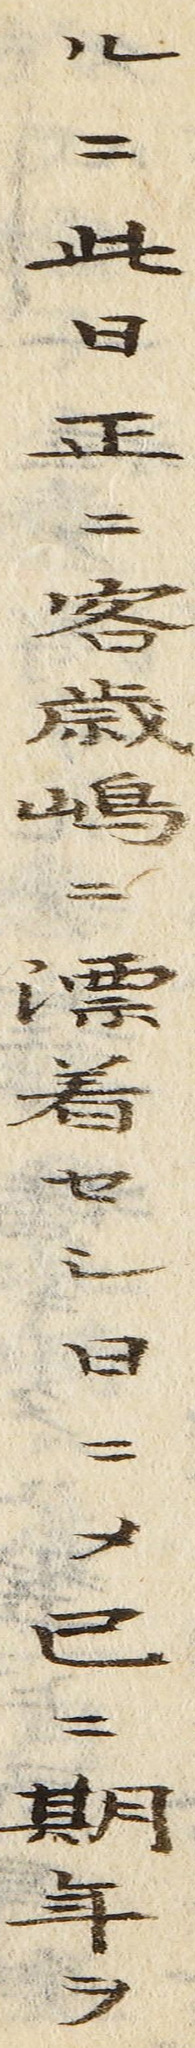ルニ此日正ニ客歳島ニ漂着セシ日ニシテ已ニ期年ヲ
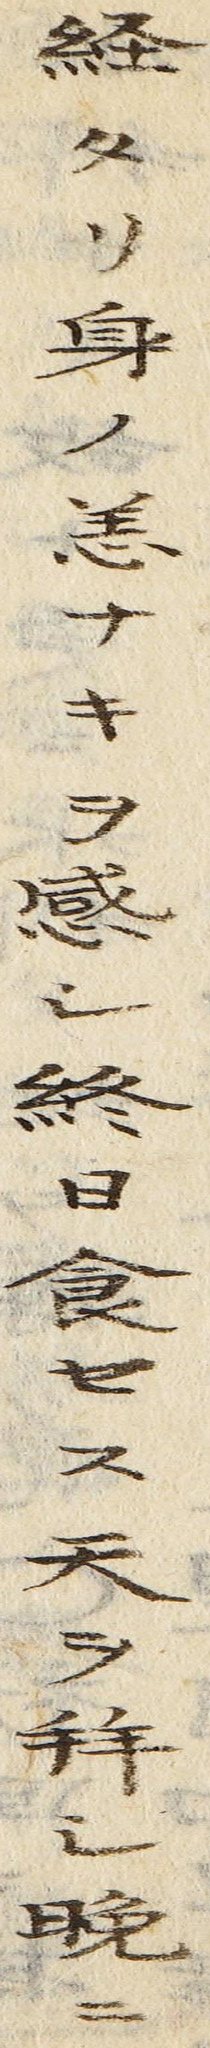経タリ身ノ恙ナキヲ感シ終日食セス天ヲ拝シ晩ニ
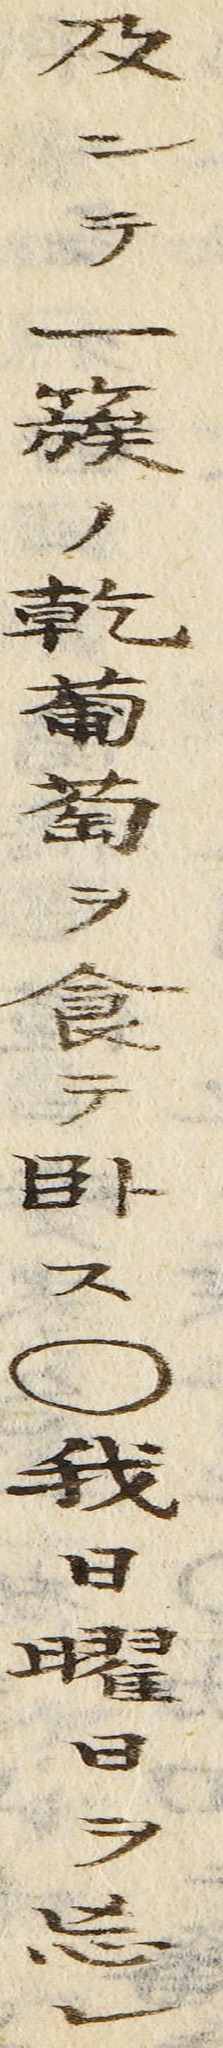及ンテ一簇ノ乾葡萄ヲ食テ臥ス◯我日曜日ヲ忘レ
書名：漂流紀事
